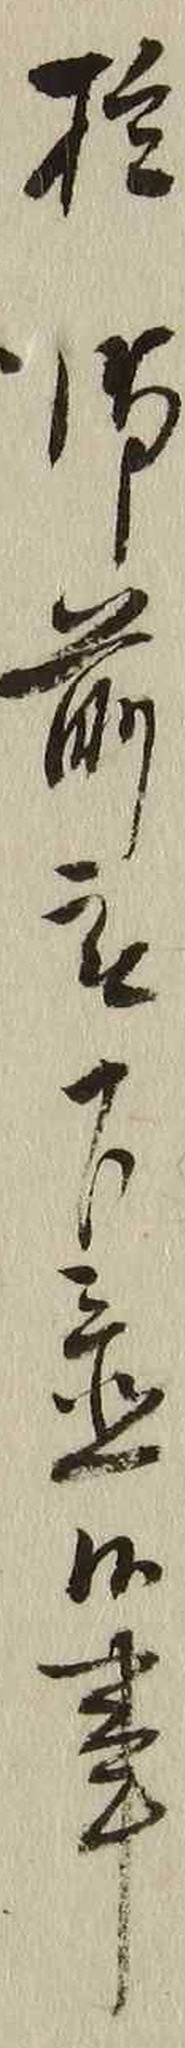於御前被下置候事
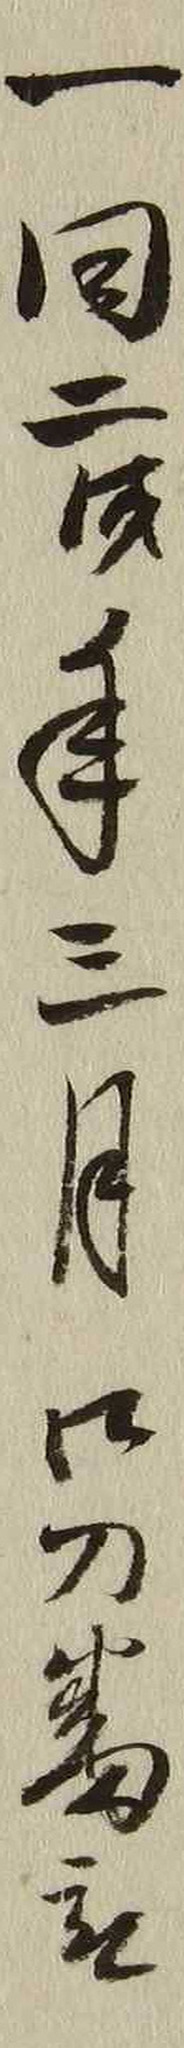一同二戌年三月御刀番被
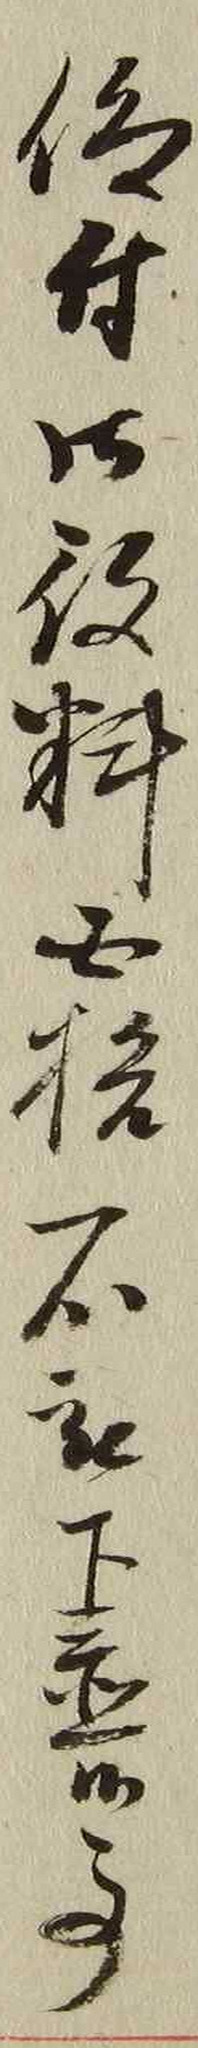仰付御役料五拾石被下置候事
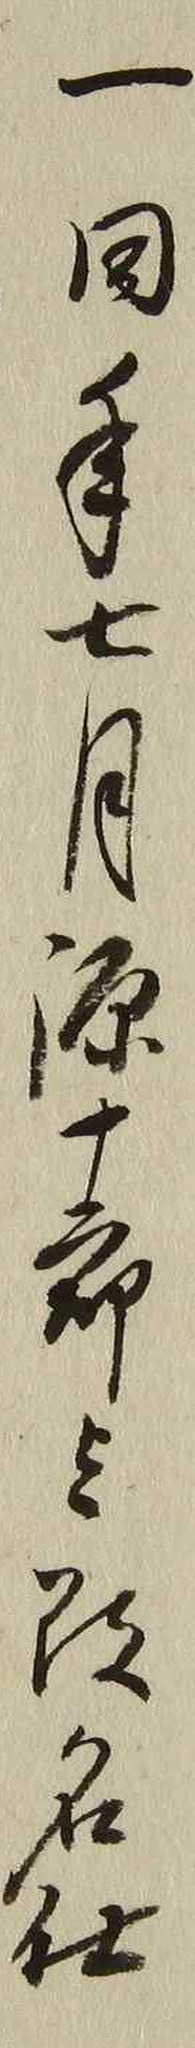一同年七月源十郎与改名仕
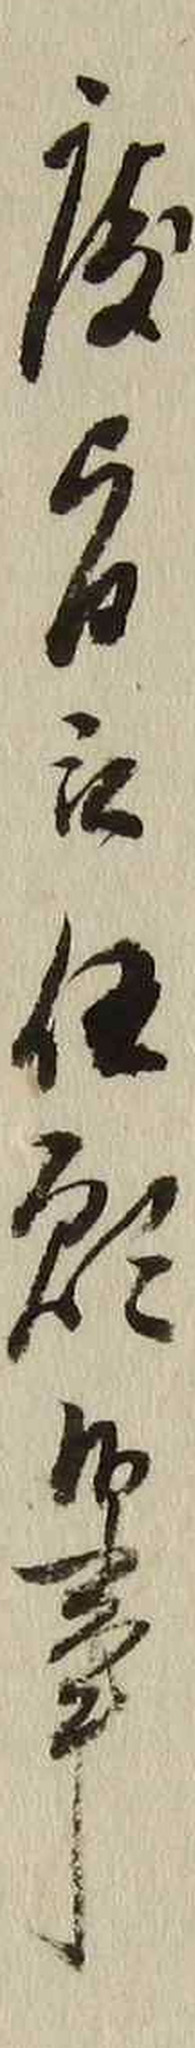度旨被任願候事
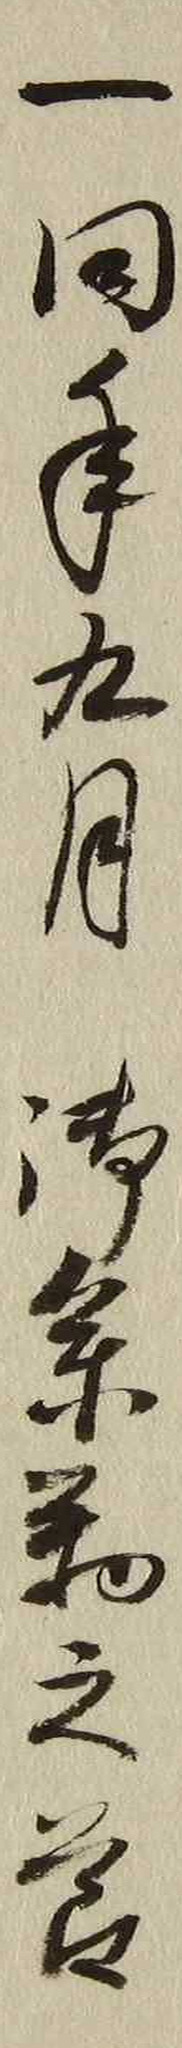一同年九月御参勤之節
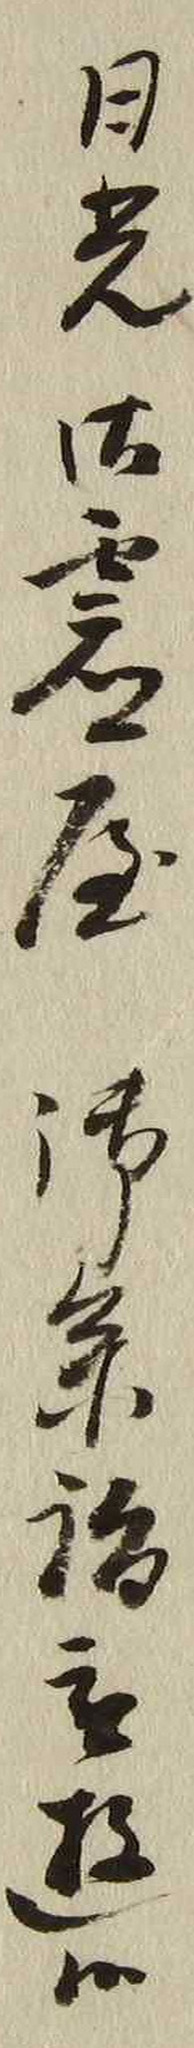日光御霊屋御参詣被遊候
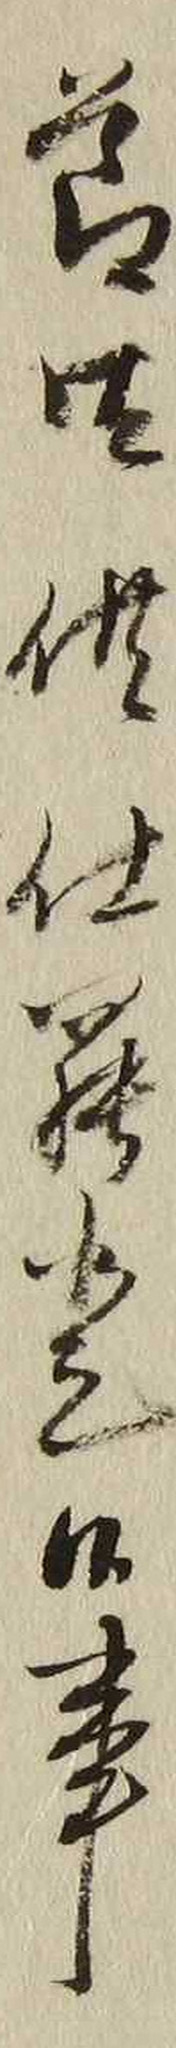節御供仕罷登候事
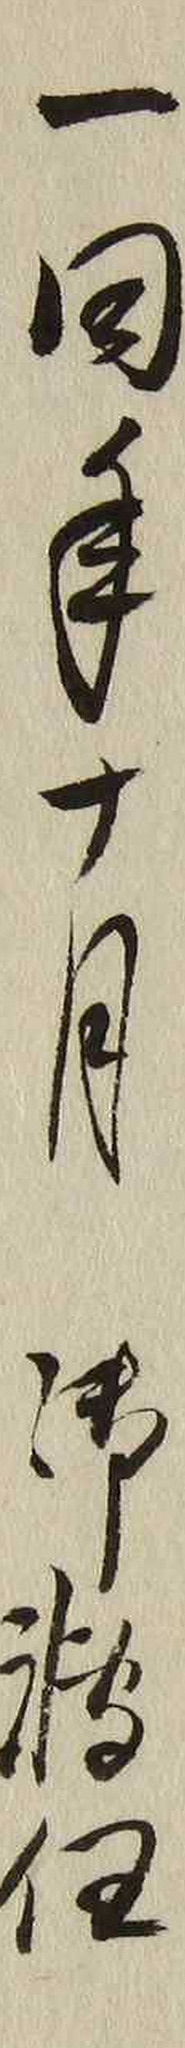一同年十月御転任
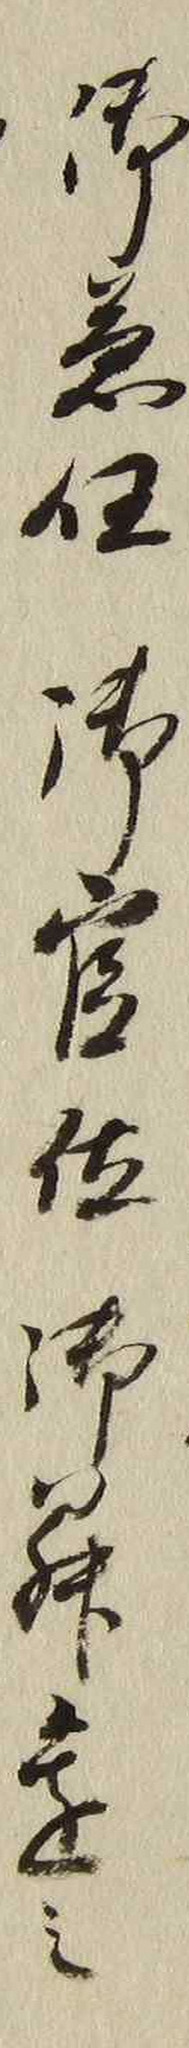御兼任御官位御昇進之
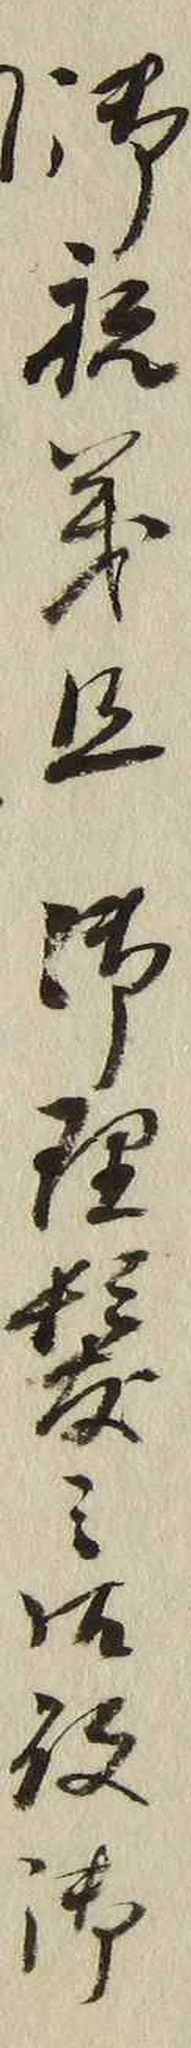御祝義且御理髪之御役御
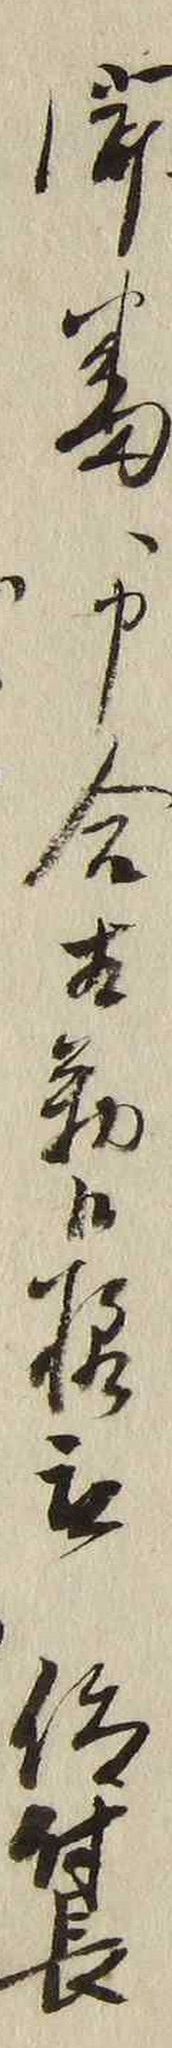聞番へ申合相勤候様被仰付長
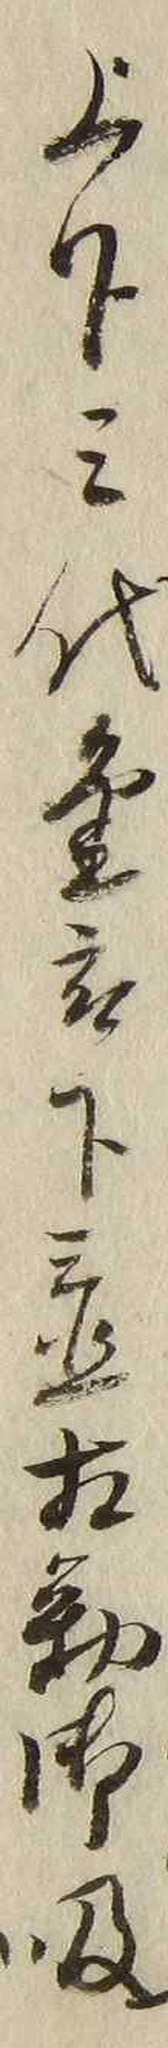上下之代金被下置相勤御吸

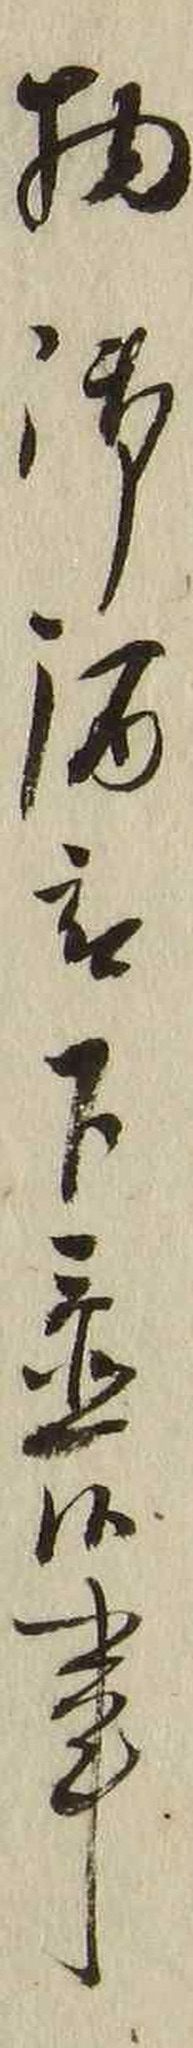物御酒被下置候事
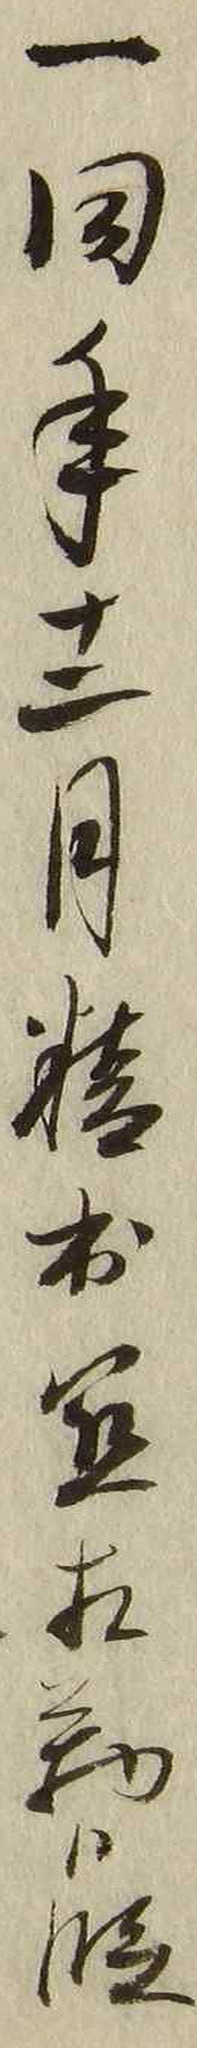一同年十二月精出宜相勤候段
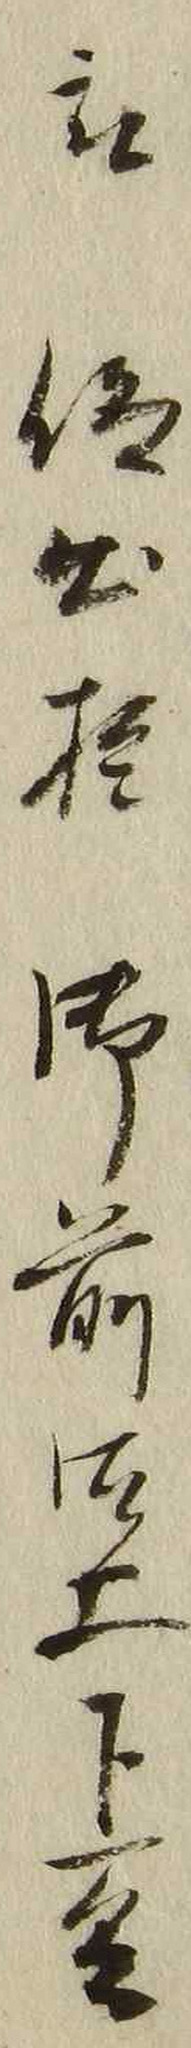被仰出於御前御上下一具
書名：諸士系譜　巻之355　す之部5
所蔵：会津若松市立会津図書館
